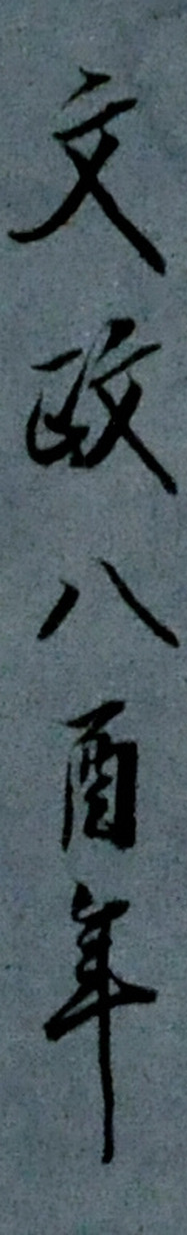文政八酉年
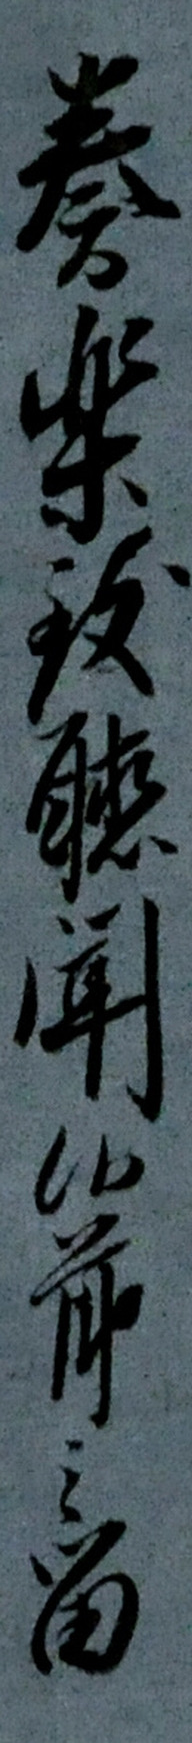奏楽致聴聞候節之留
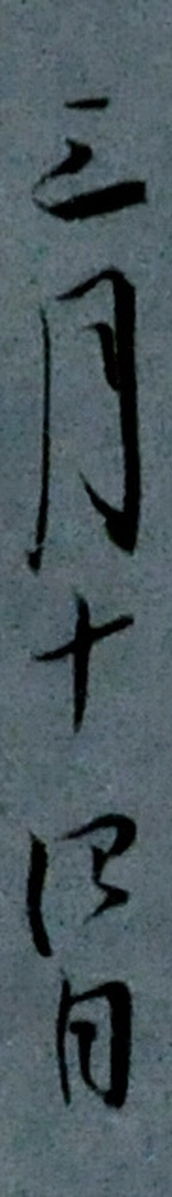三月十四日
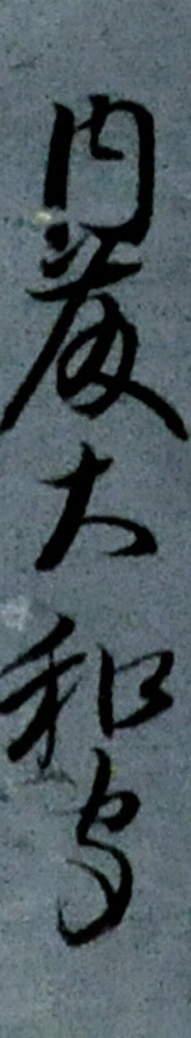内藤大和守

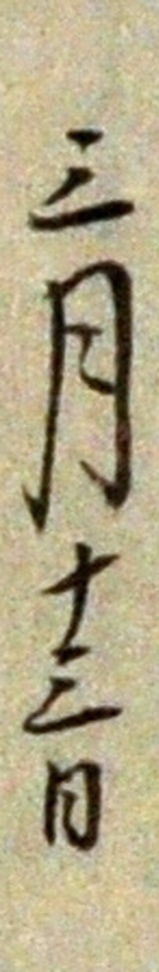三月十三日
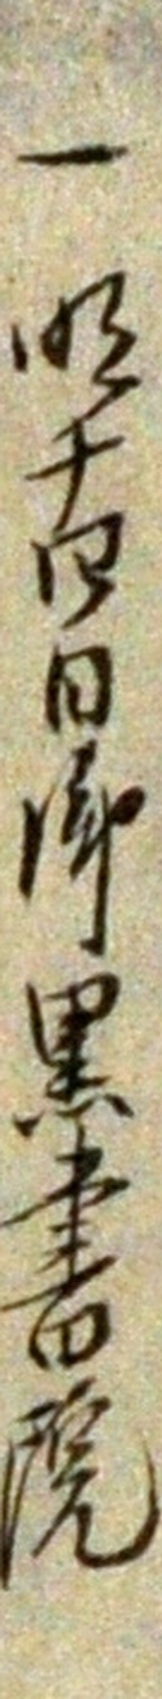一明十四日御黒書院
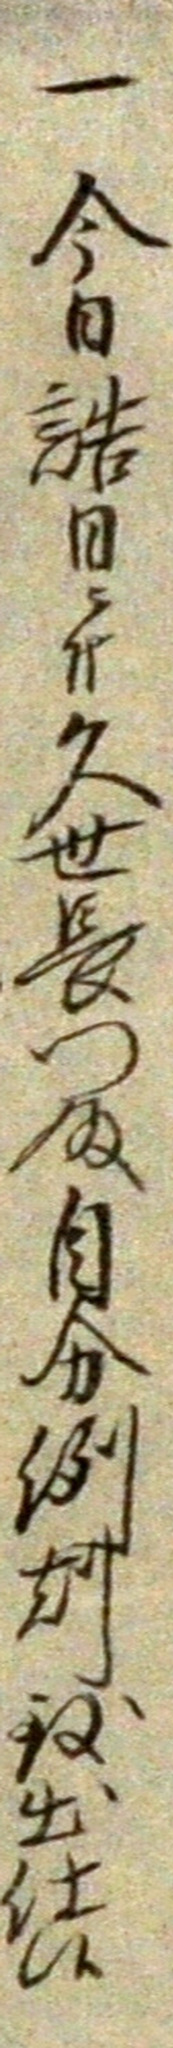一今日詰日ニ付久世長門殿自分例刻致出仕候
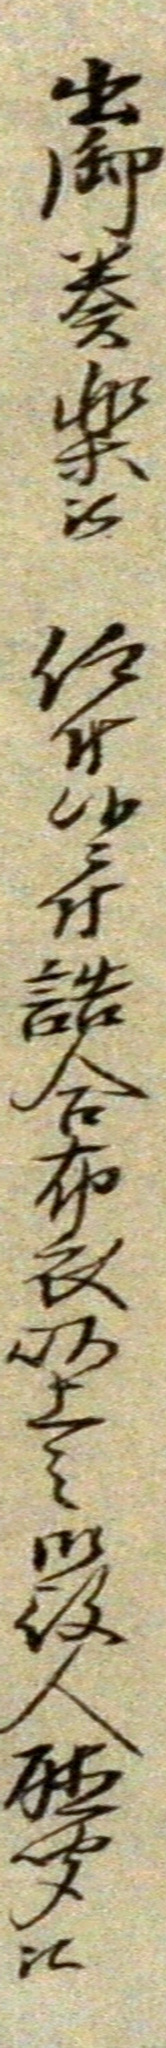出御奏楽被仰付候ニ付詰合布衣以上之御役人聴聞被
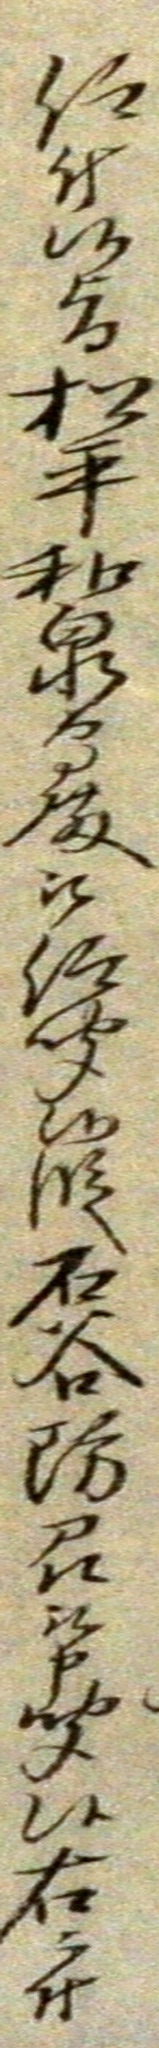仰付候旨松平和泉守殿被仰聞候段石谷防州被申聞候右ニ付
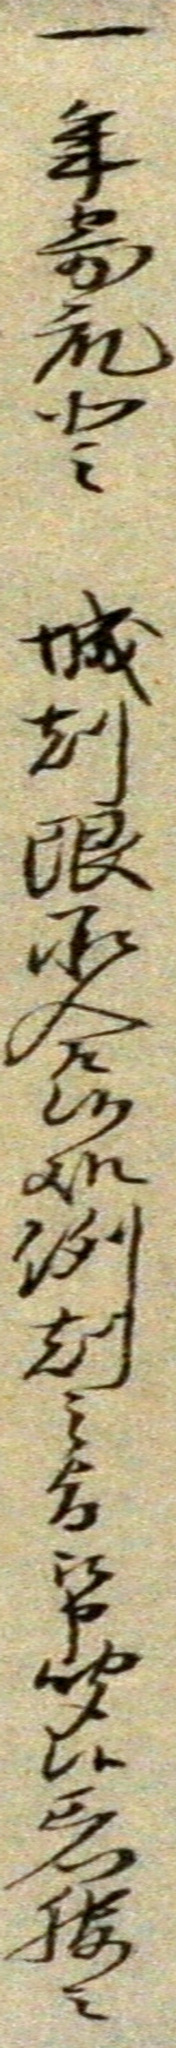一年寄衆登城刻限承合候処例刻之旨被申聞候着服之
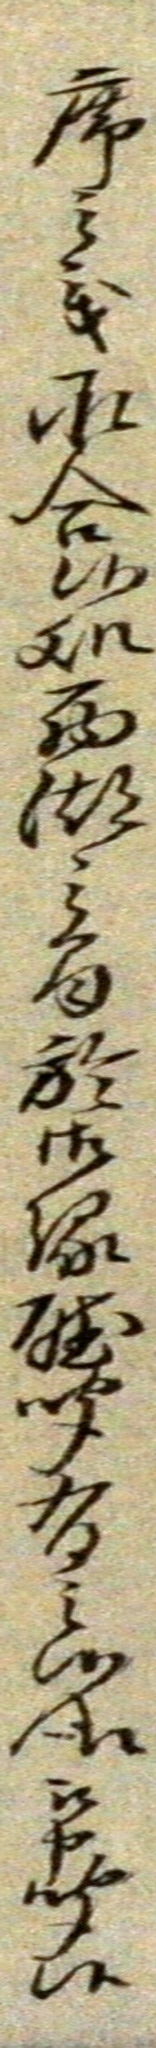席之義承合候処西湖之間於御縁聴聞有之候様被申聞候
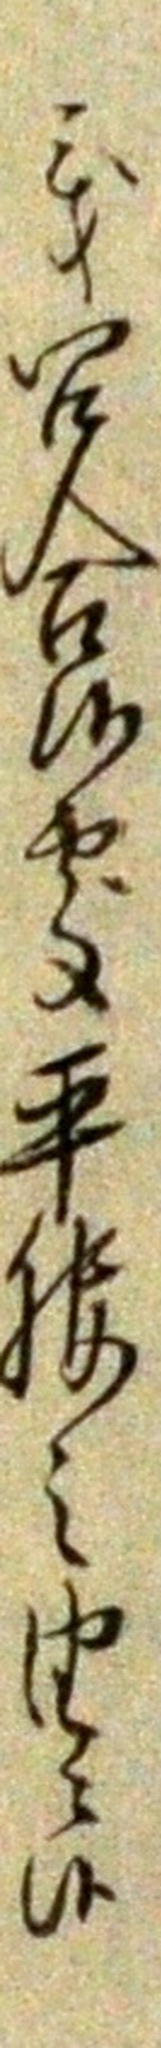義問合候処平服之由ニ候
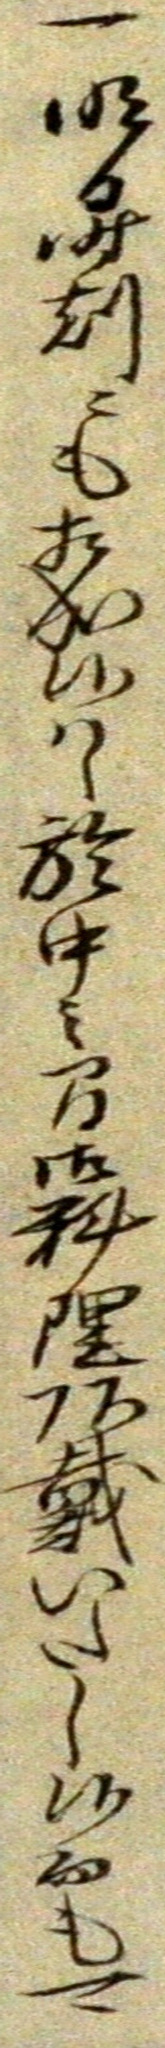一明日時刻ニも相成候ハヽ於中之間御料理頂戴いたし候而も可
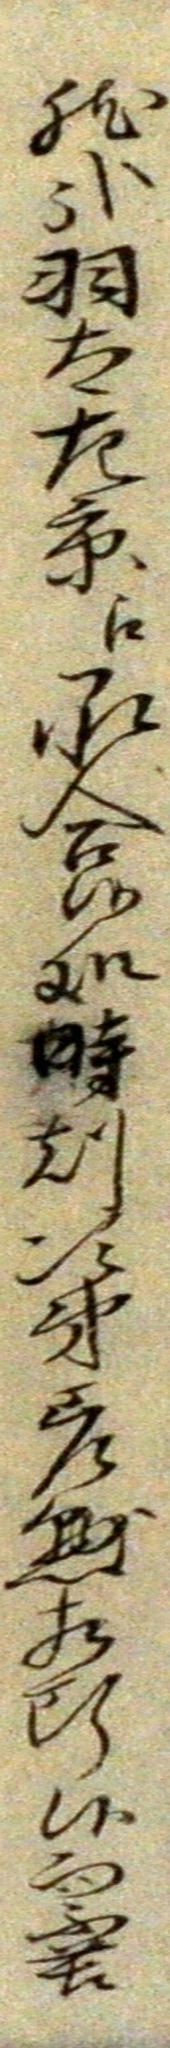然哉羽太左京え承合候処時刻次第差懸相断候而不苦
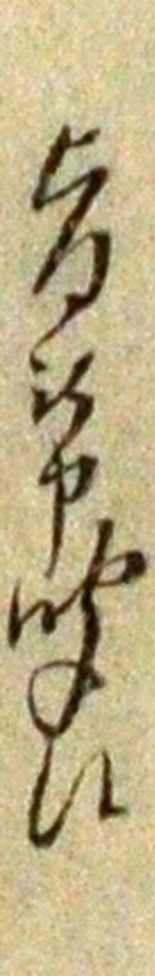旨被申聞候
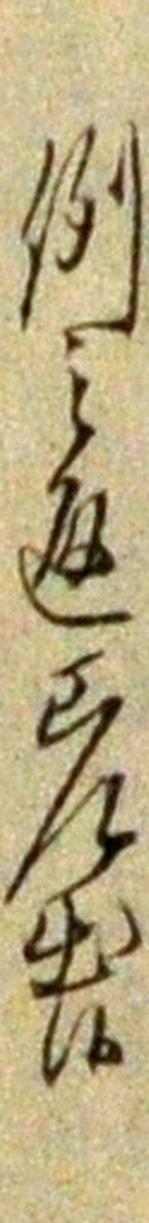例之通差出候
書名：奏楽聴聞致シ候節ノ留
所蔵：伊那市立高遠町図書館・合同会社AMANE
